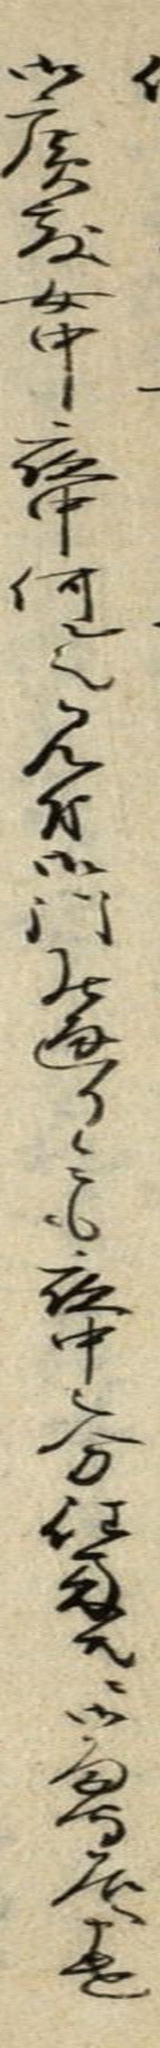一御広敷女中夜中何レ之見付御門罷通り候ニも夜中之分往来共ニ御留守居へ申遣
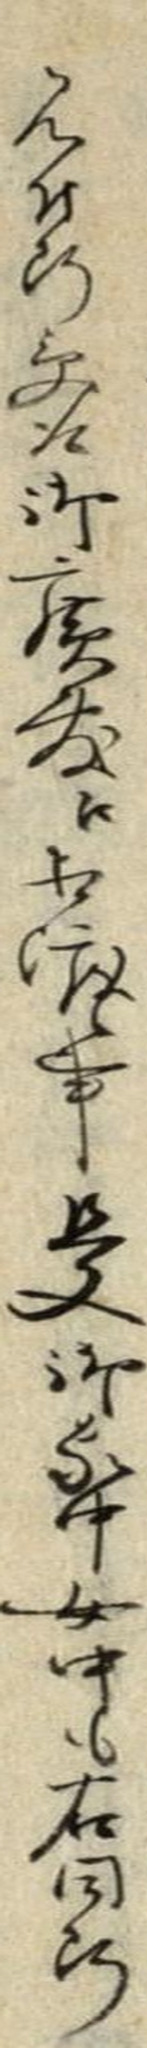見付断受取御広敷江相渡候事且又御家中女中も右同断
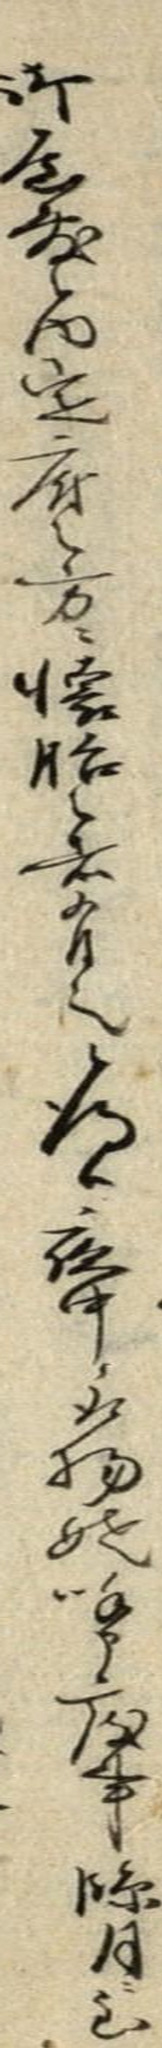一御屋敷之内定府之方々ニ懐胎之者有之候得ハ夜中取揚姥呼申度事臨月ニ至
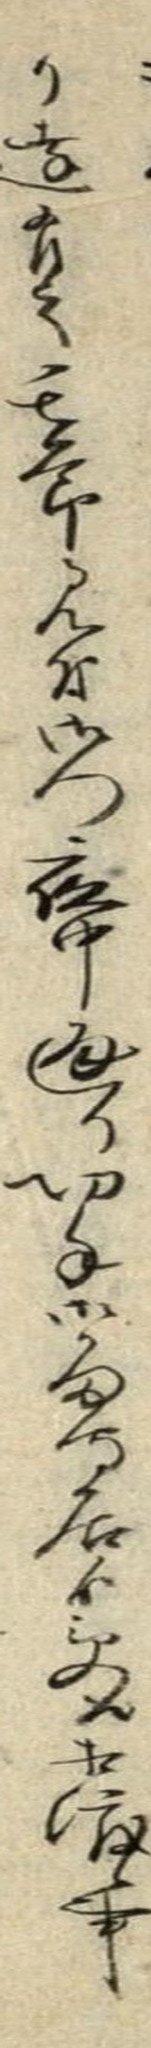り達有之其節見付御門夜中通り切手御留守居ゟ受取相渡候事
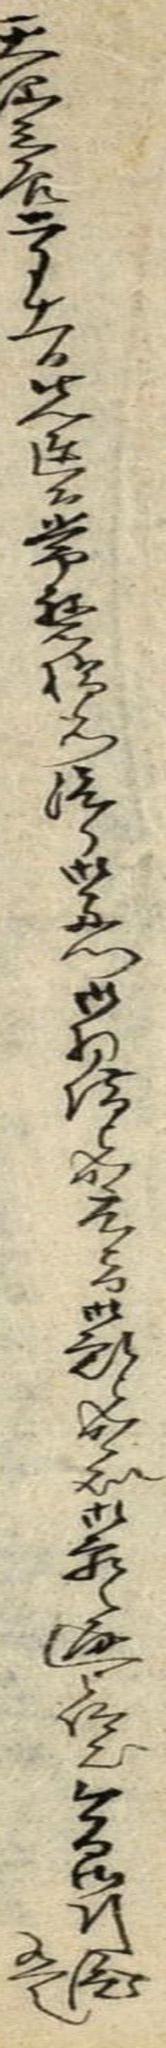一天保三辰二月十一日先達而常盤橋御門渡り御多門御拝借被成度旨御願被成候処御願之通被仰出今日御引渡有之

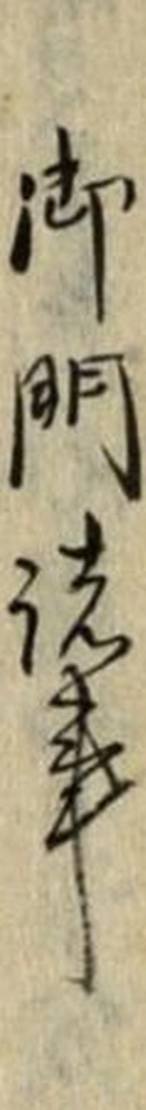御門諸事
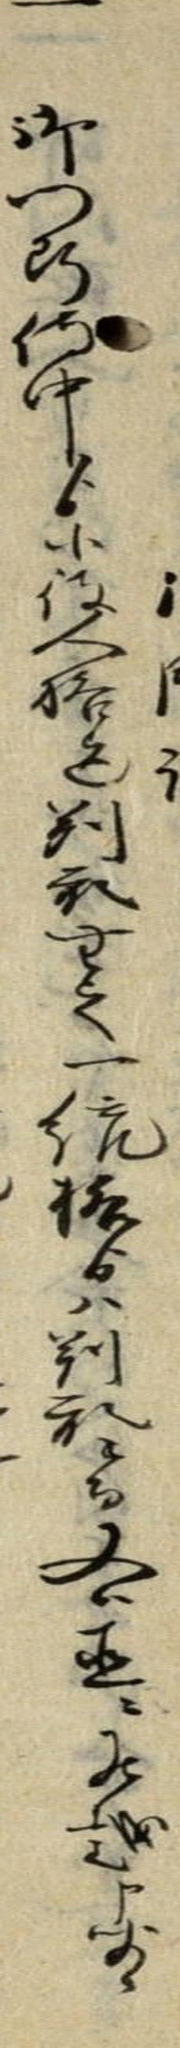一御門断侍中ゟ小役人格迄判形無之一統格ゟは判形にて又は直に罷越申聞候
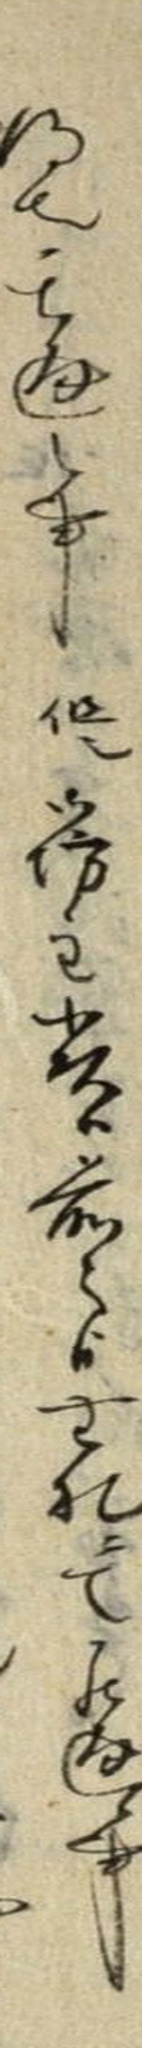得は其通之事但し御坊主小頭は前々ゟ無札にて罷通候事
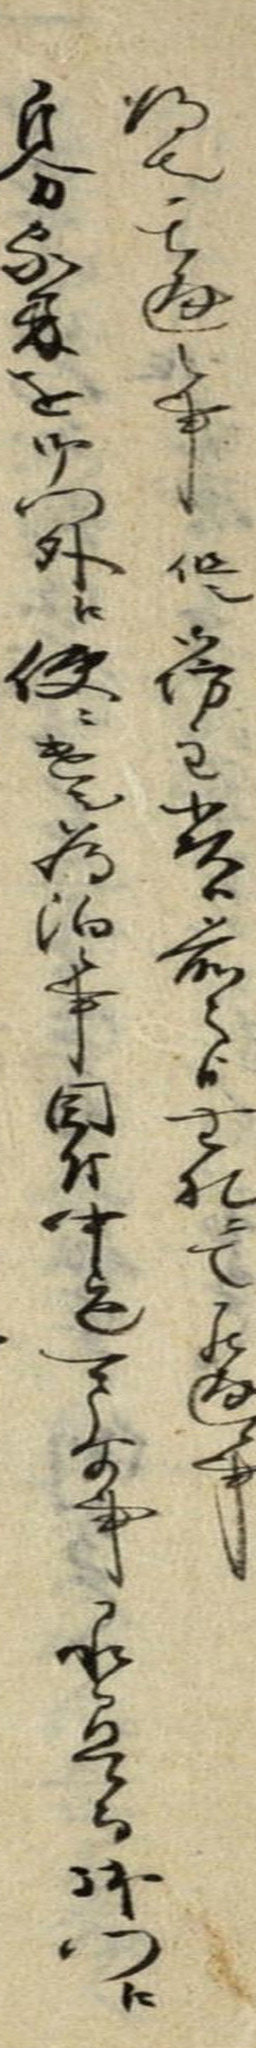一自分家来を御門外江使に遣し為泊候事目付中迄可申聞事承置候て御門江
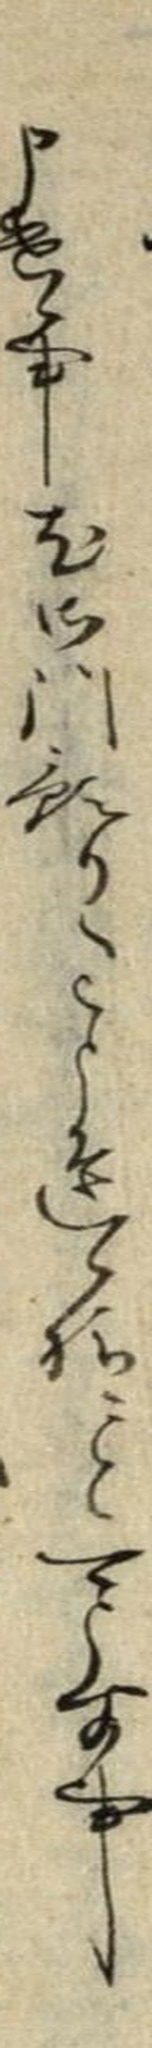申遣候事尤御門預りへ被申達候様にと可申聞事
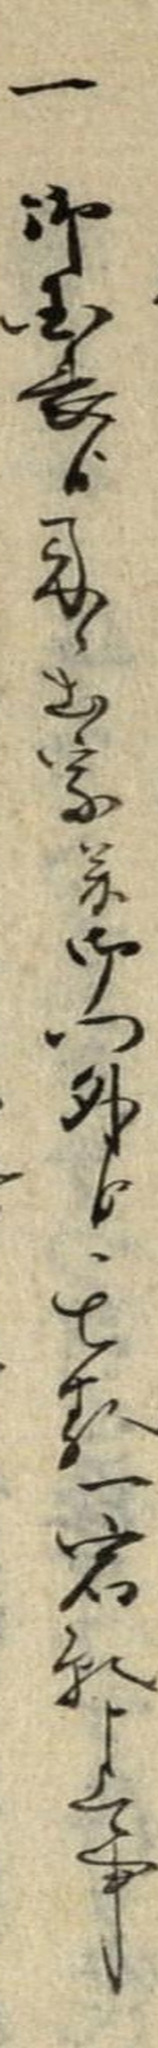一御国表ゟ来候出家幷御門外ゟ其類一宿頼申上候事
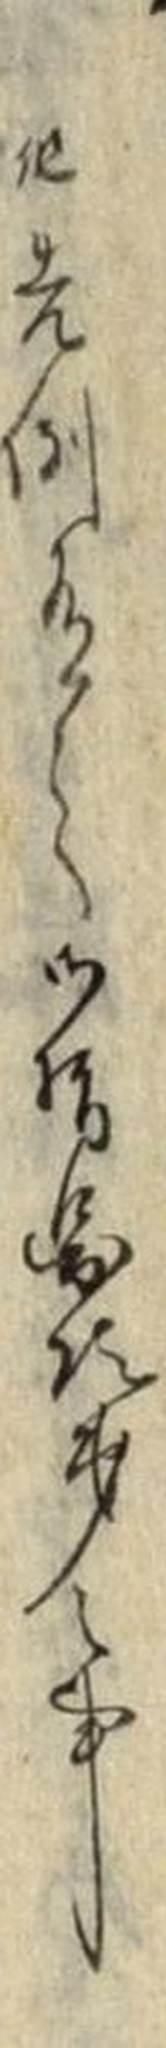但先例有之御指図次第之事
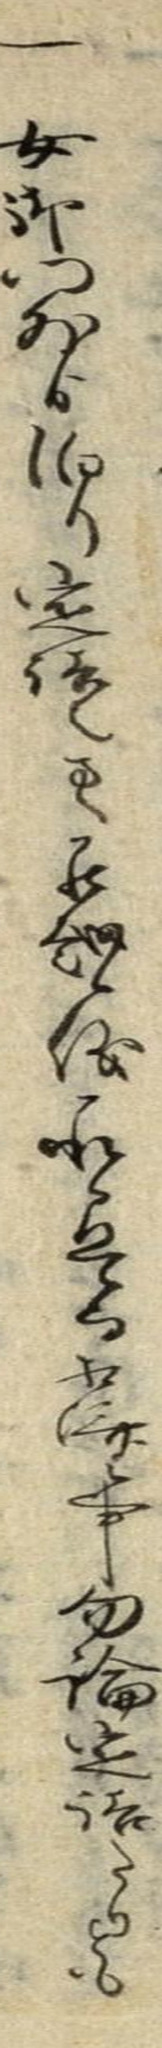一女御門外ゟ泊り定詰之方へ罷越候儀承置候て相済之事勿論定詰たりとも
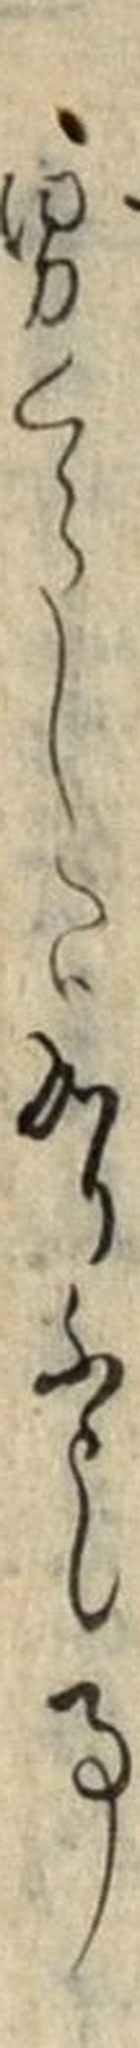男くらしへは成り不申事
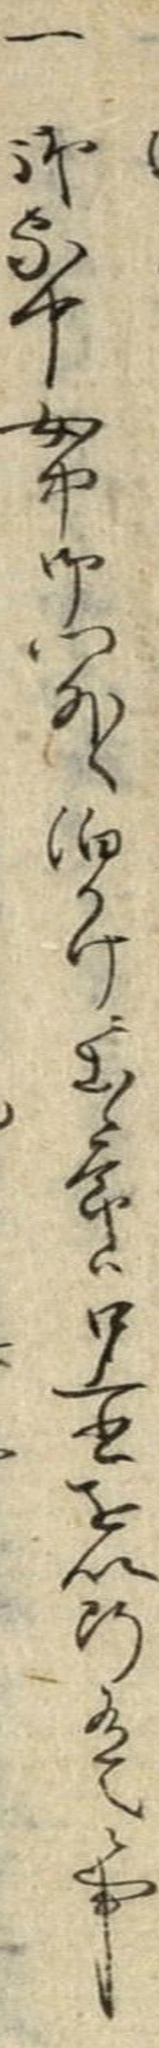一御家中女中御門外へ泊かけに出候節は口上書を以断有之候事
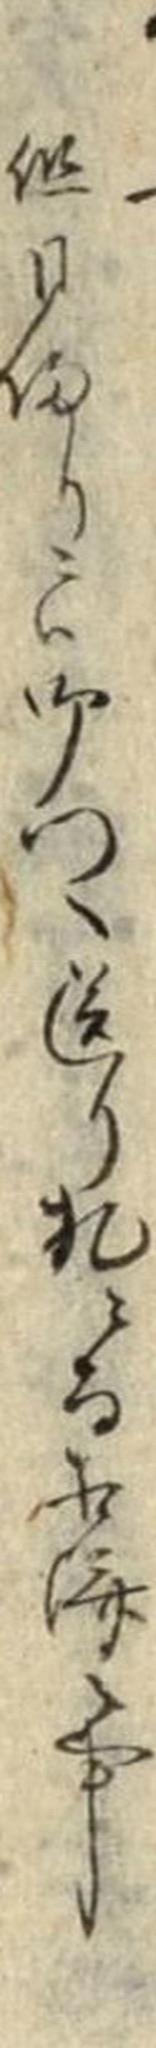但日帰りには御門へ送り札にて相済之事
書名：三都并道中之部
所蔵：福井県文書館 Fukui Prefectural Archives
